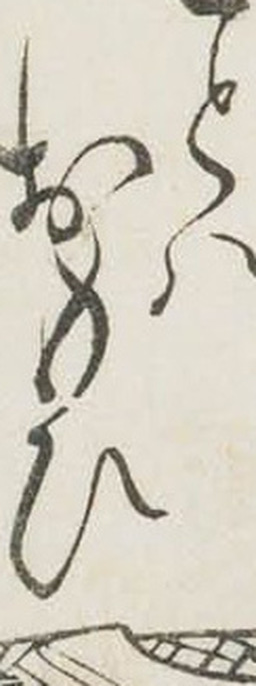おもひ
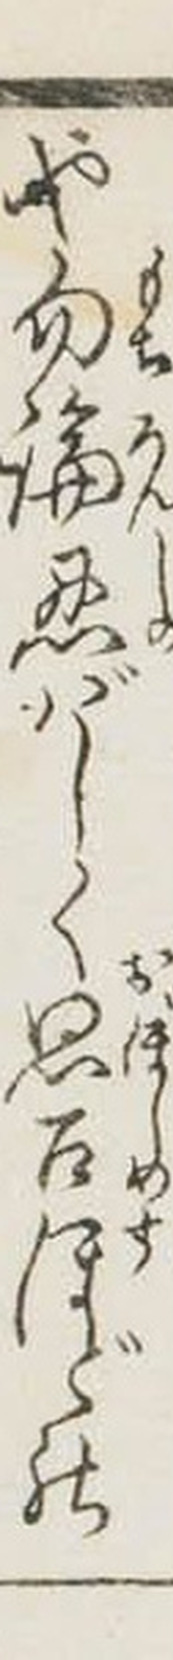や勿論忍ばしく思召ほどの
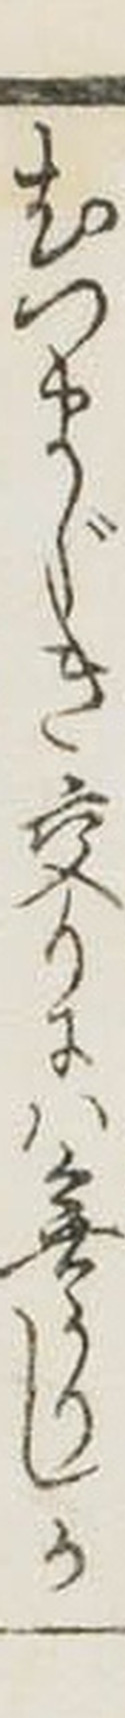むつまじき交りには無かりしか
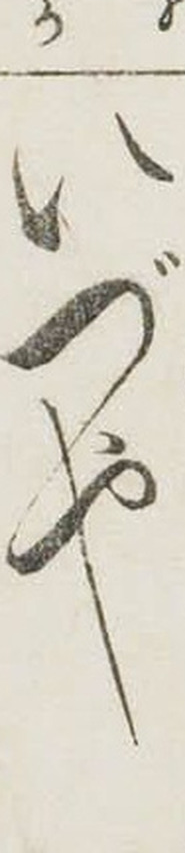いづや
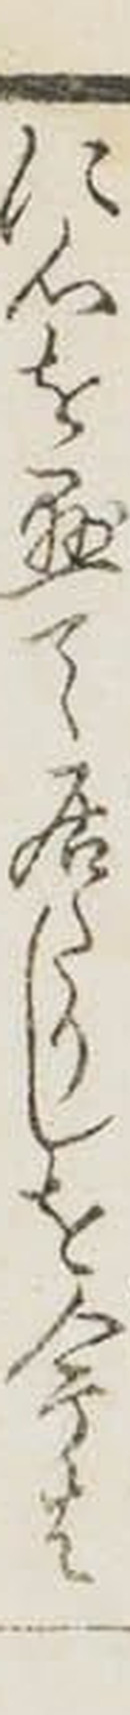に心を懸て居たりしを今は
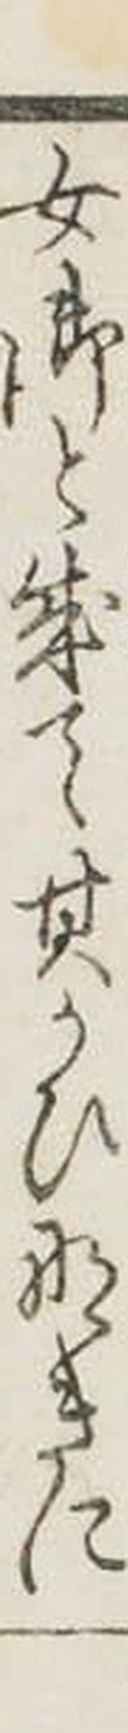女御と成て其かひなきに
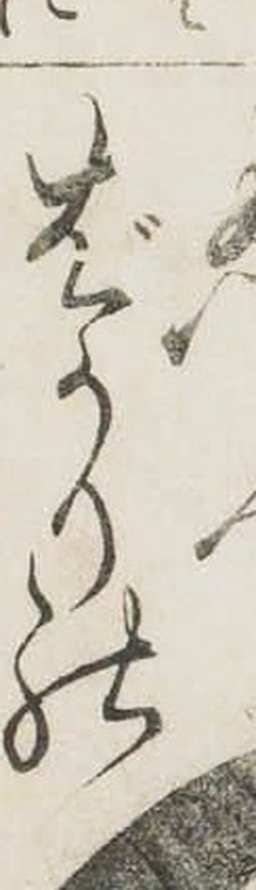ばかりの
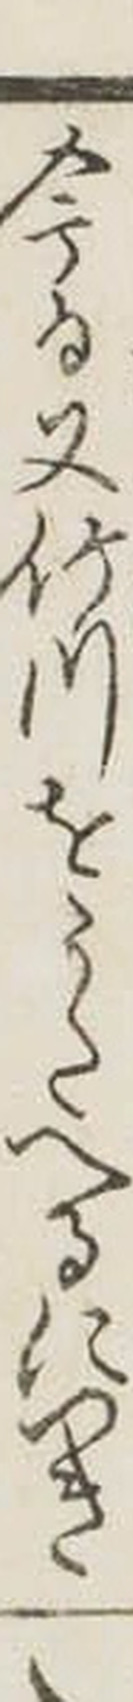今日又竹川をうたへるにつき
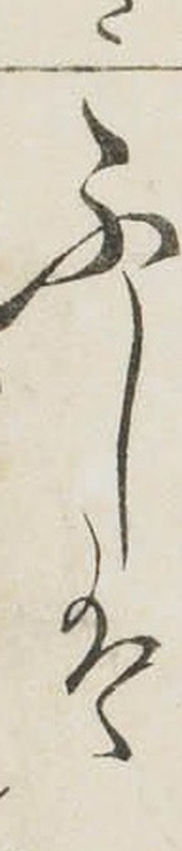ふしは
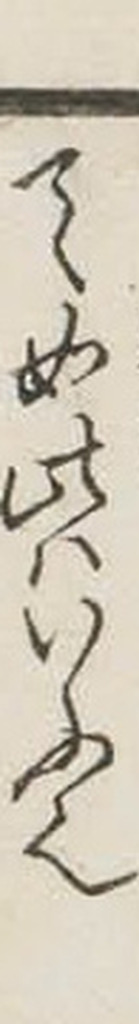て如此はいふ也
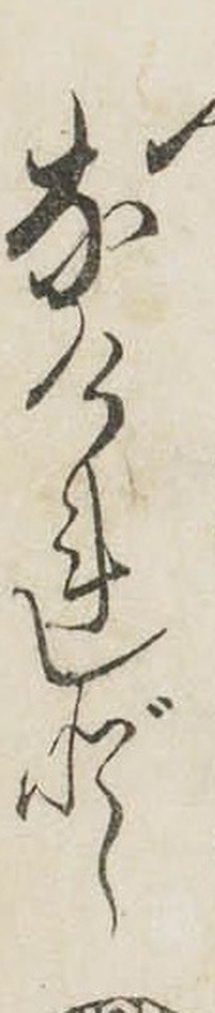なけれど

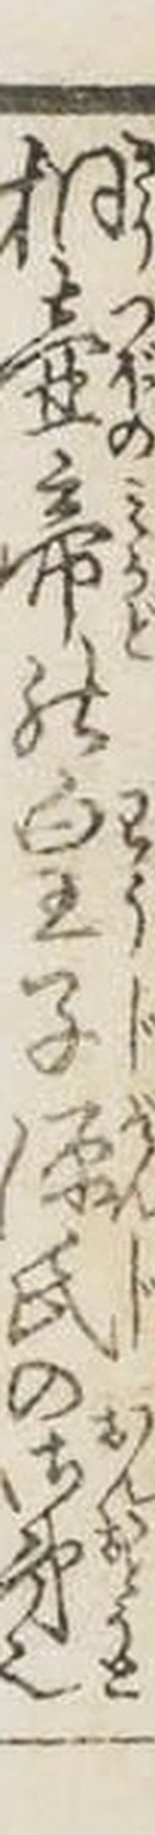桐壺帝の皇子源氏の御弟也
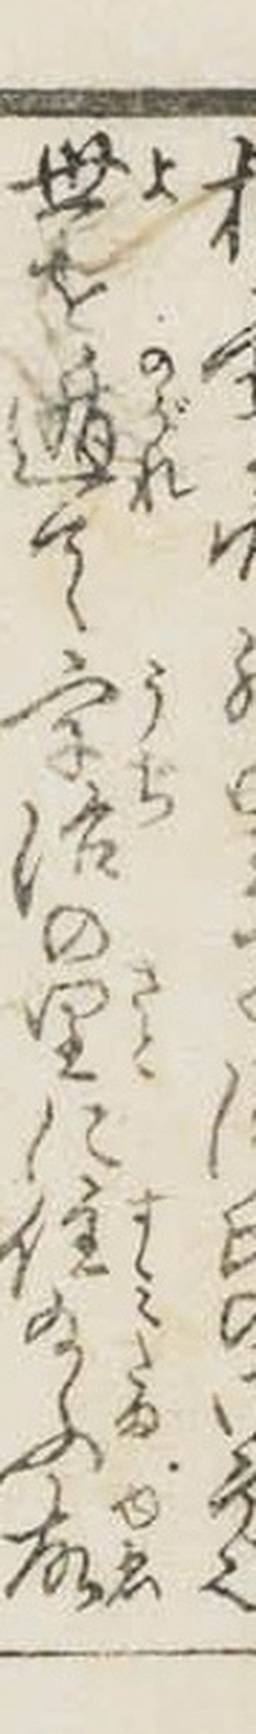世を遁て宇治の里に住給ふ故
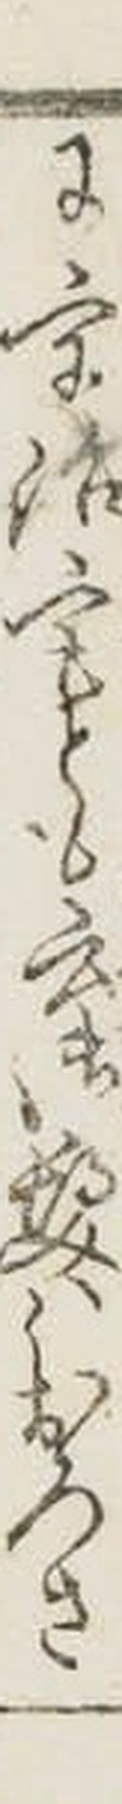に宇治宮とも云御髪はおろさ
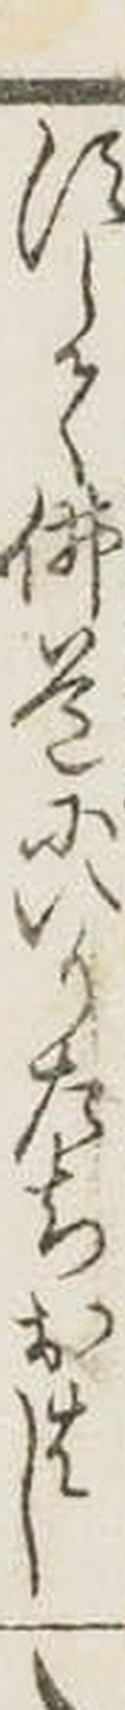ずして仏道にいりたちおはし
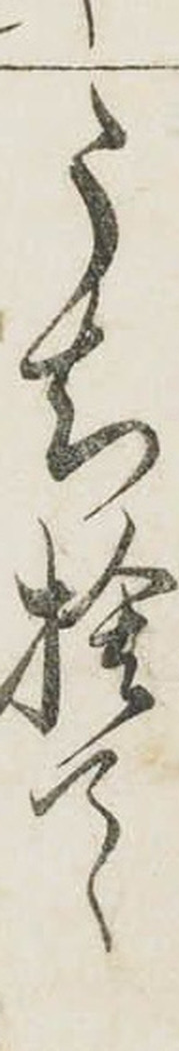うち捨て
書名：源氏百人一首
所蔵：東京学芸大学教育コンテンツアーカイブ
